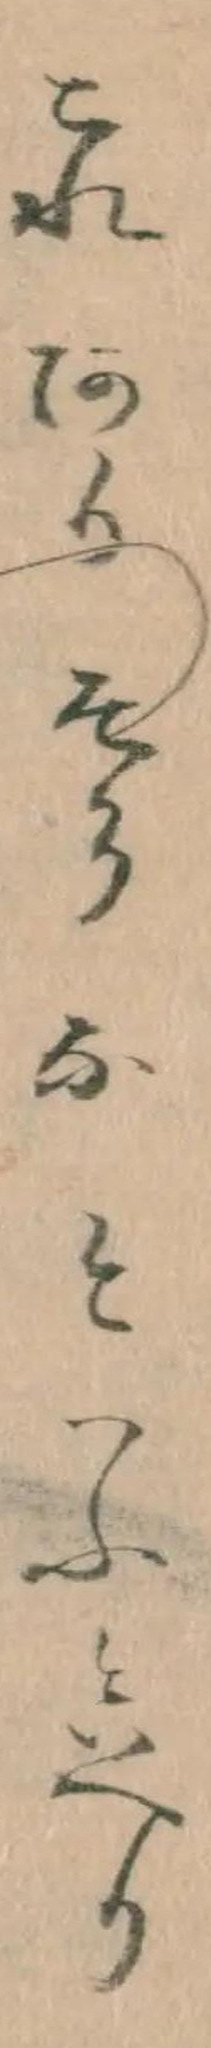これありそうなといふといへり

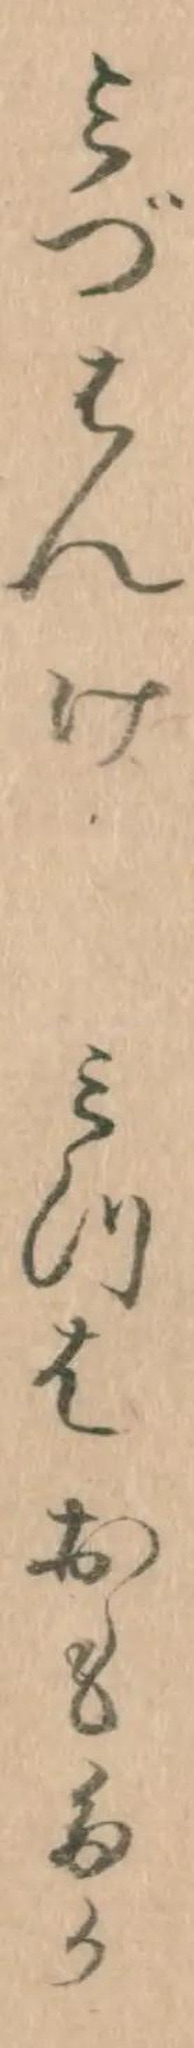みづはんけみつはおもたか
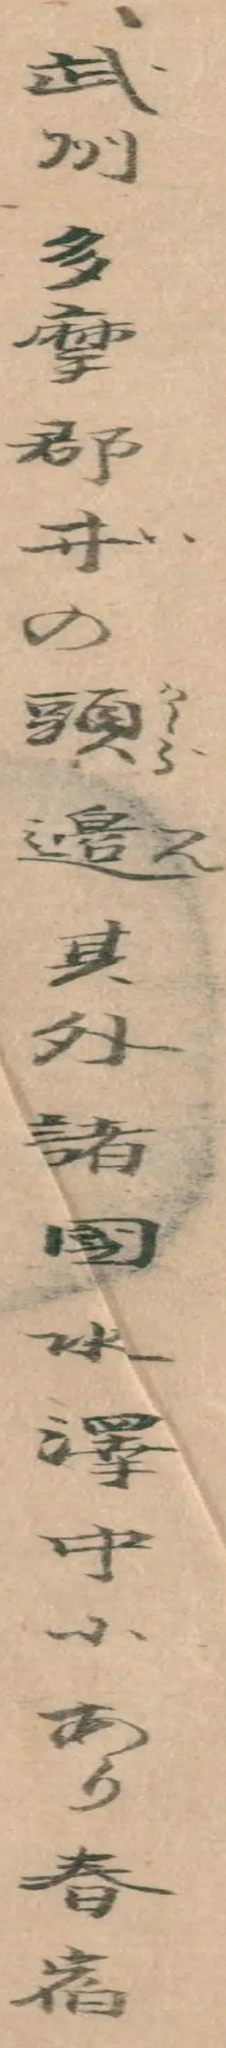武州多摩郡井の頭辺其外諸国水沢中にあり春宿
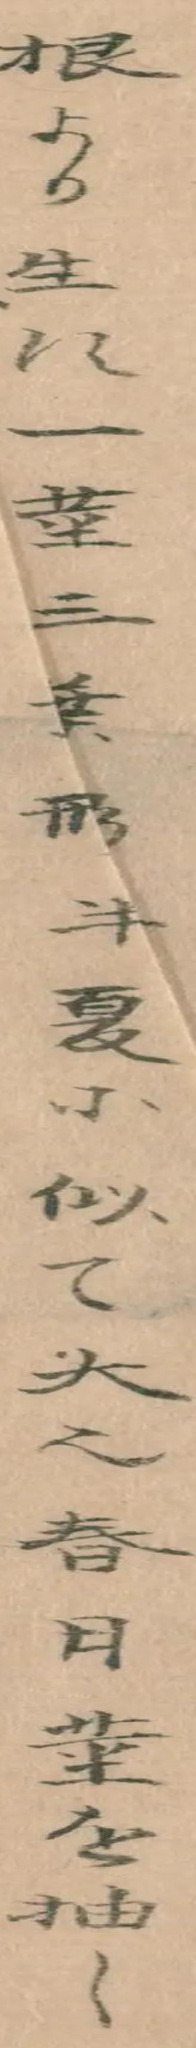根より生す一茎三葉形半夏に似て大也春月茎を抽し
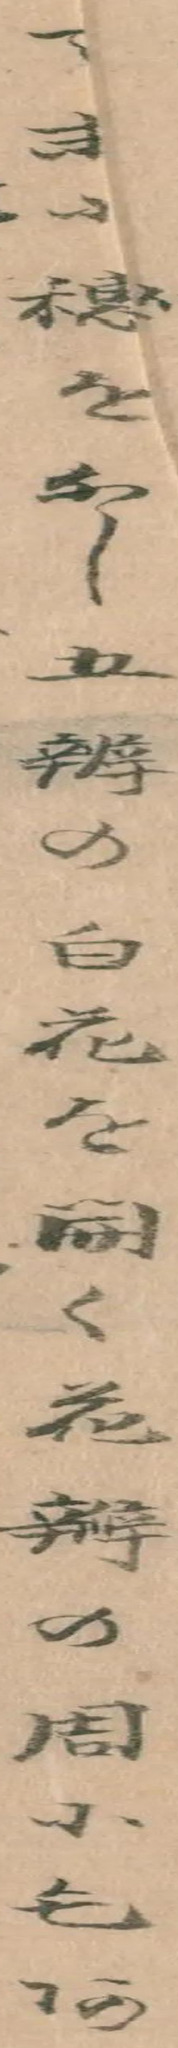て末に穂をなし五弁の白花を開く花弁の周に毛あ
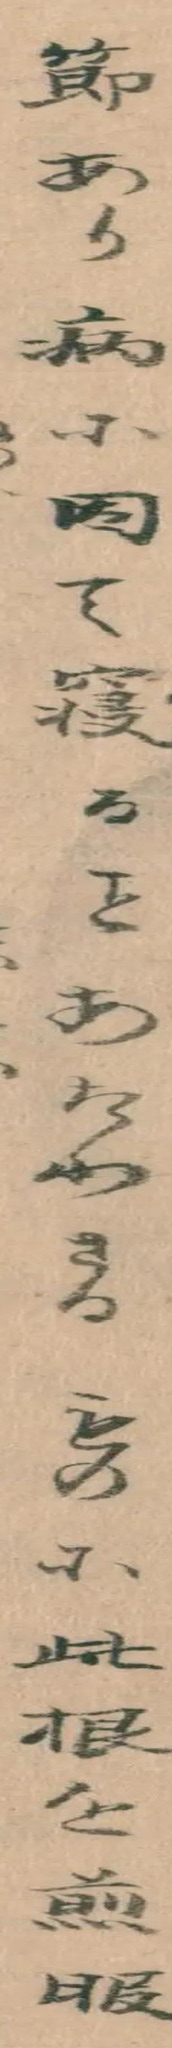節あり病に因て寝ることあたわさるものに此根を煎服
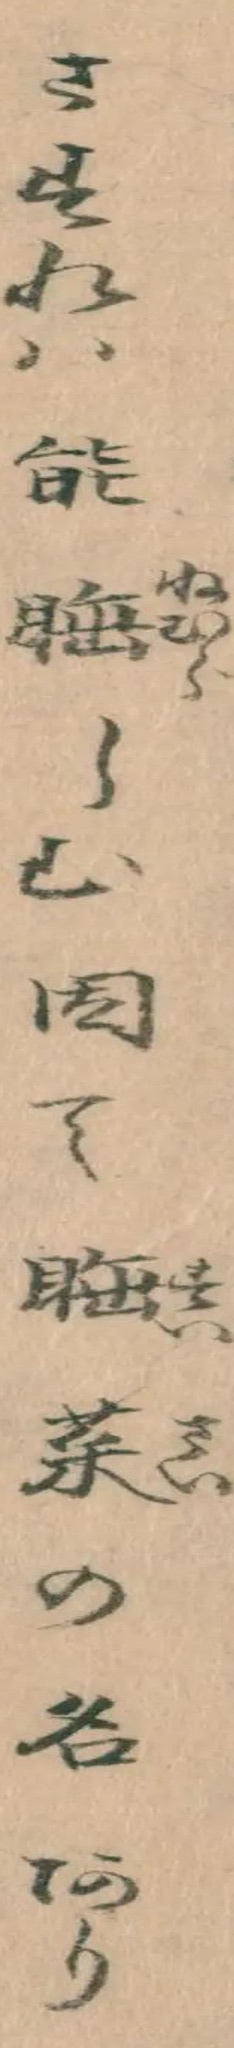さすれは能睡しむ因て睡菜の名あり

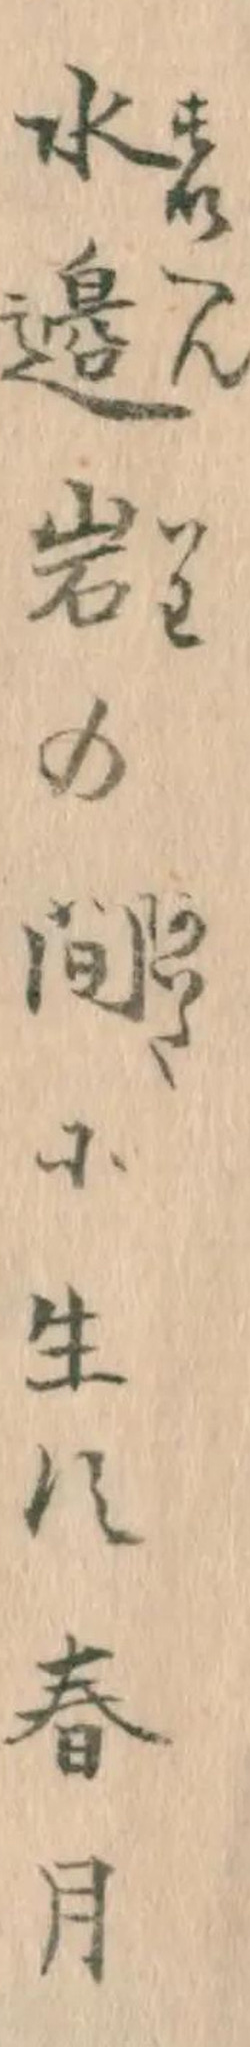水辺岩の間に生す春月
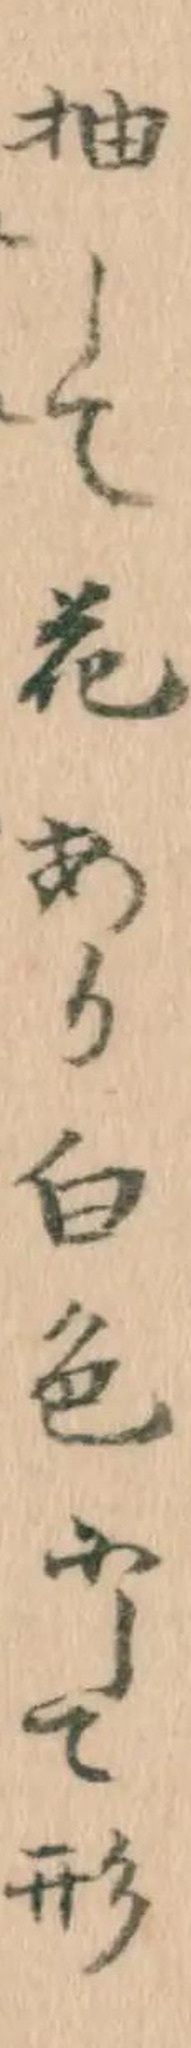抽して花あり白色にして形
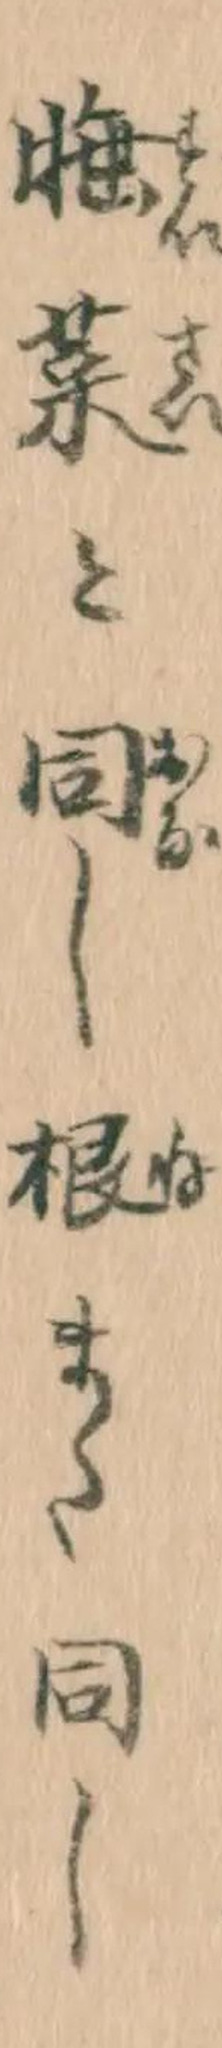睡菜と同し根また同し
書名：本草図譜. 巻52-54
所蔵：国立国会図書館 National Diet Library, JAPAN
